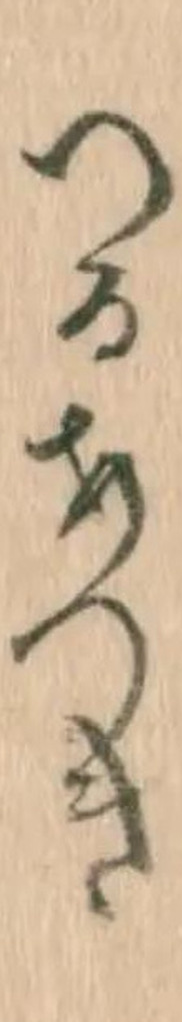つるあつき
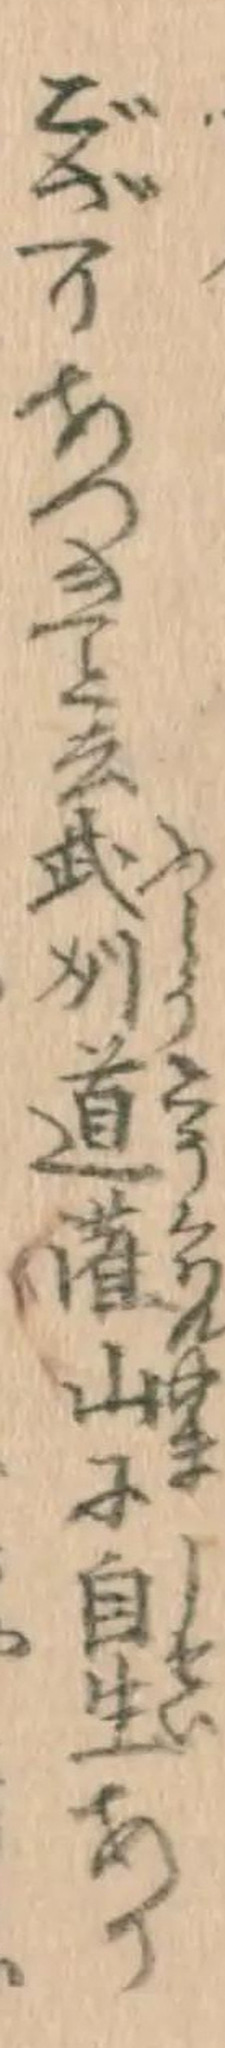ござりあつきと云武州道灌山に自生あり
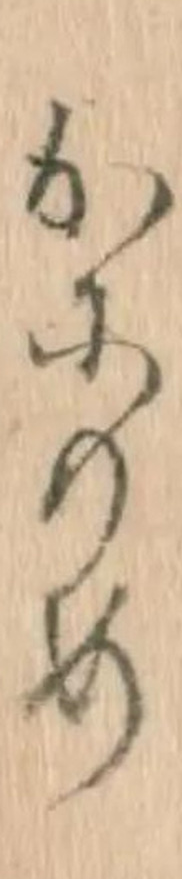かにのめ
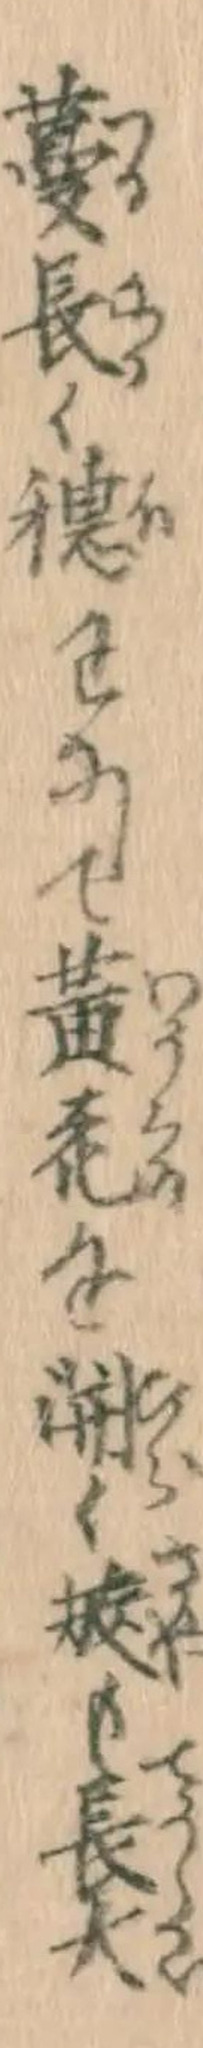蔓長く穂をなして黄花を開く莢も長大
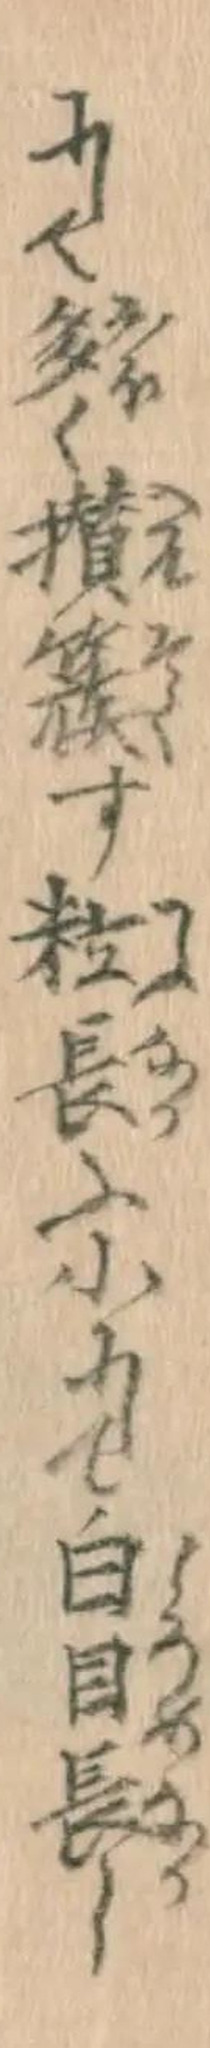にして多く攢簇す粒長ふ小にして白目長し
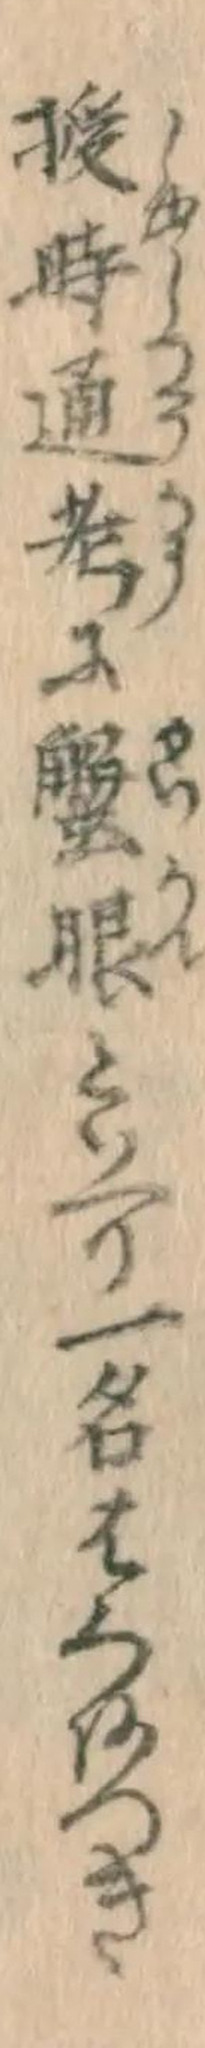授時通考に蟹眼といへり一名はくあつき
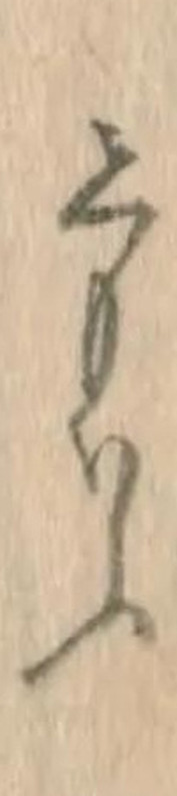ともいふ

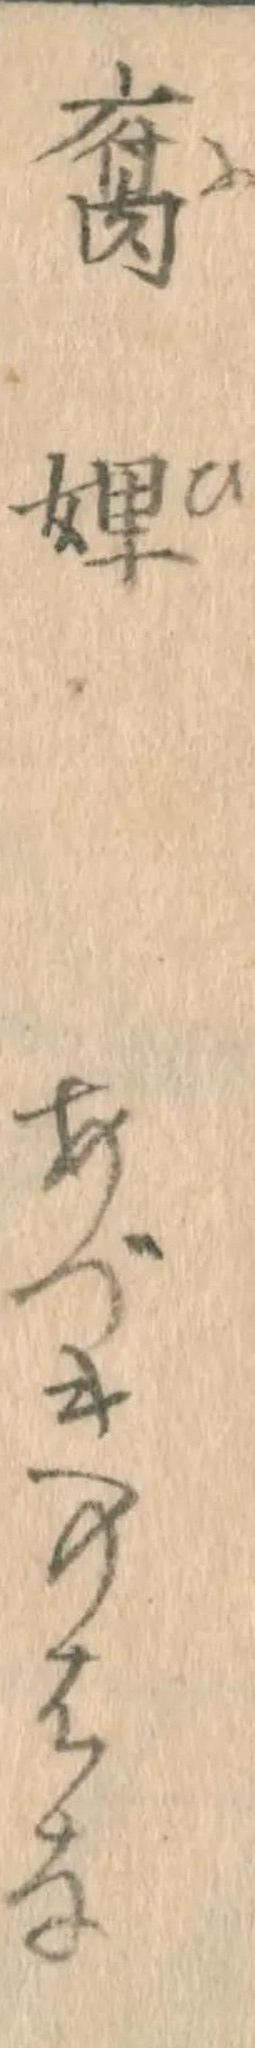腐婢あづきのはな
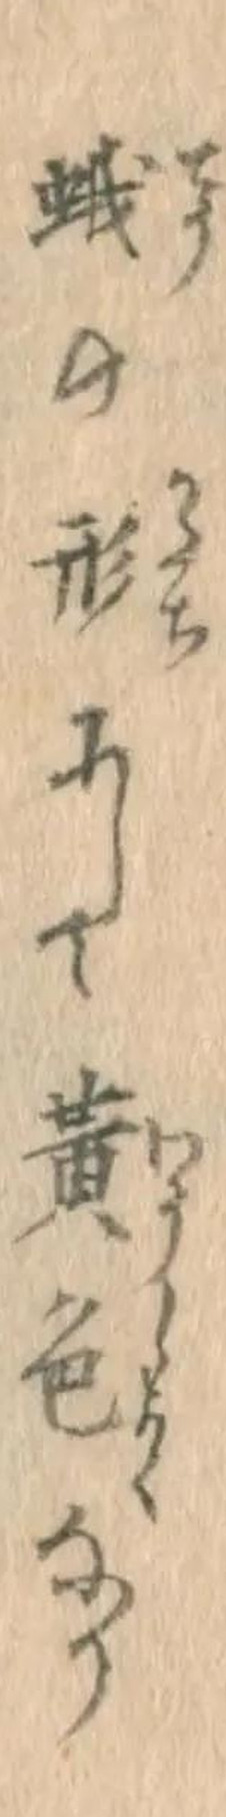蛾の形にして黄色なり
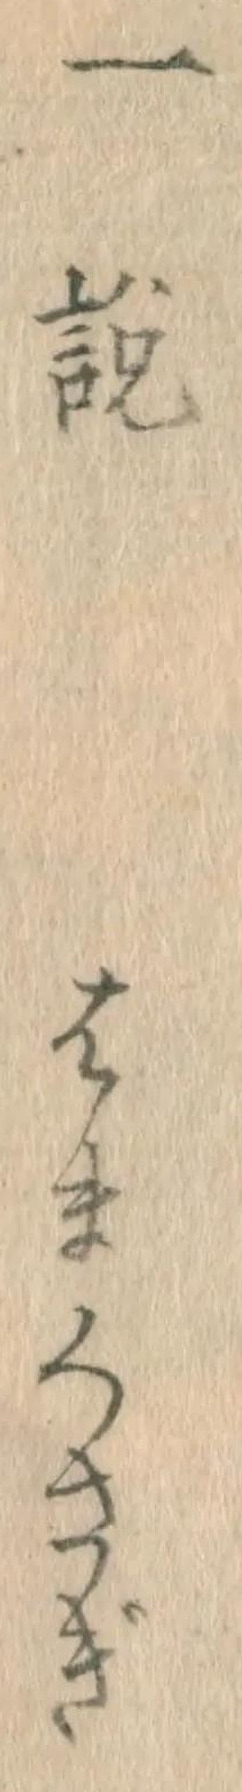一説はまくさぎ
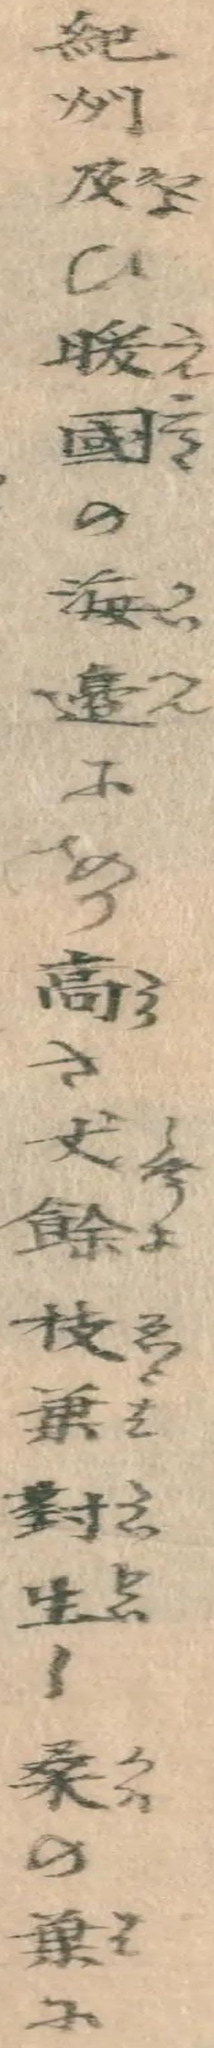紀州及ひ暖国の海辺にあり高さ丈余枝葉対生し桑の葉に
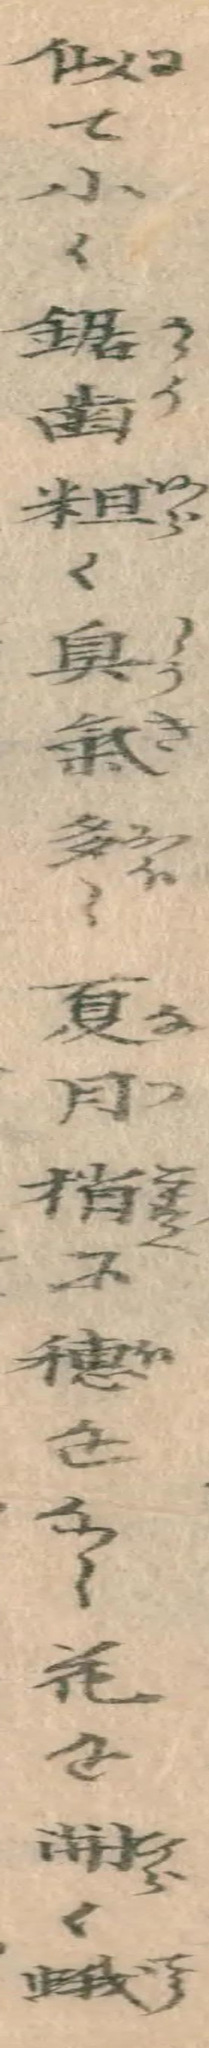似て小く鋸歯粗く臭気多し夏月梢に穂をなし花を開く蛾

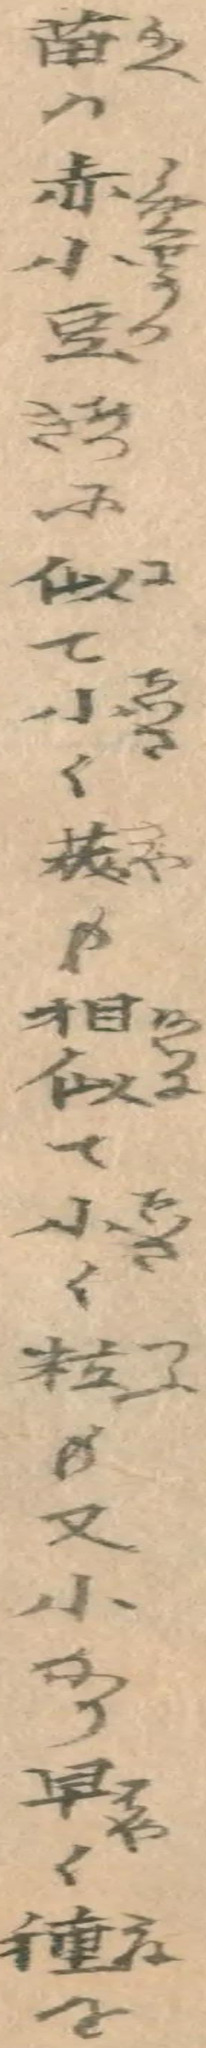苗は赤小豆あつきに似て小く莢も相似て小く粒も又小なり早く種を
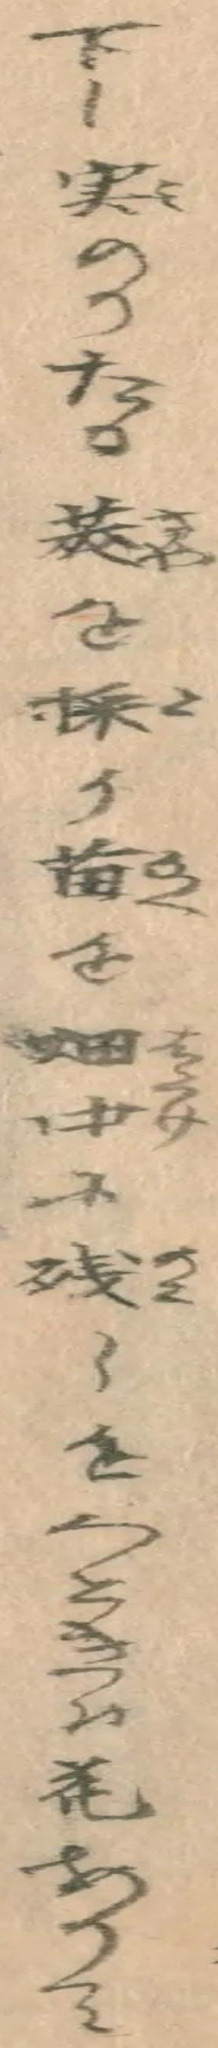下し実のりたる莢を採り苗を畑中に残しをくときは花ありて
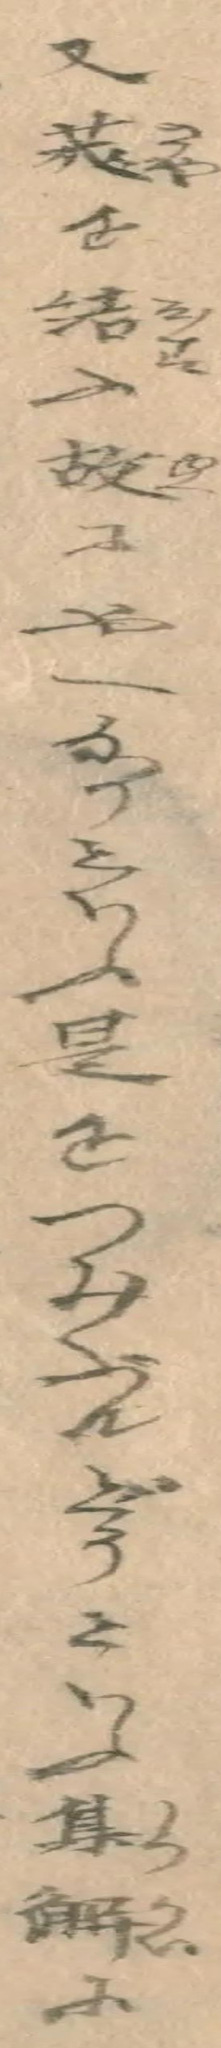又莢を結ふ故にやへなりといふ是をつみぶんどうといふ集解に

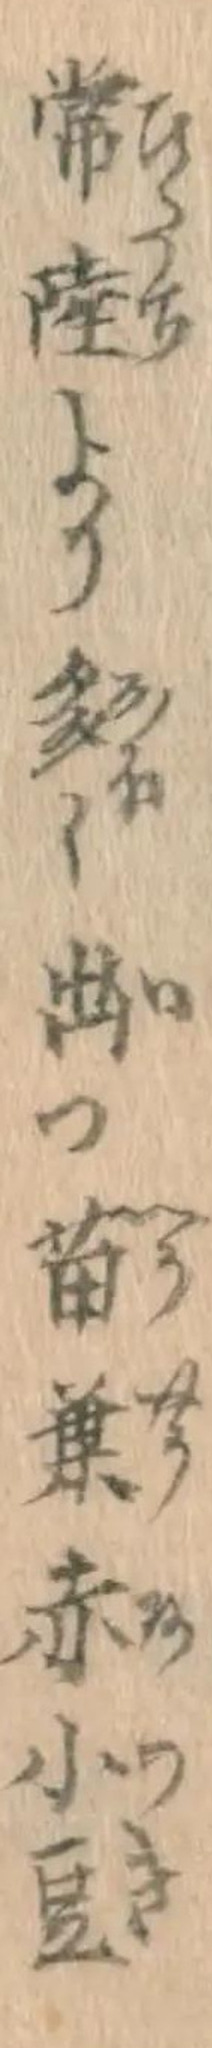常陸より多く出つ苗葉赤小豆
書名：本草図譜. 巻43-45
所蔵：国立国会図書館 National Diet Library, JAPAN
